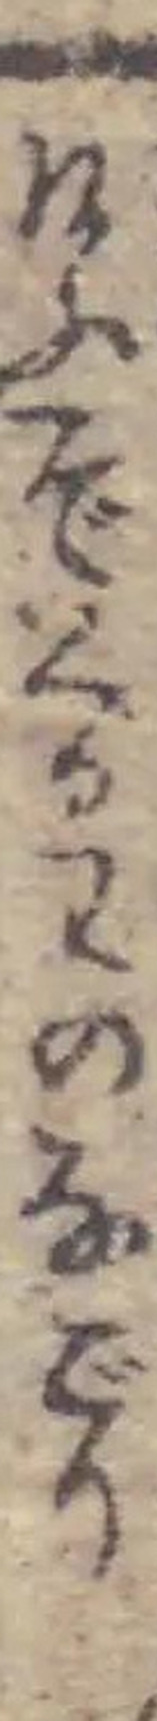けふぞいくるわのなごり
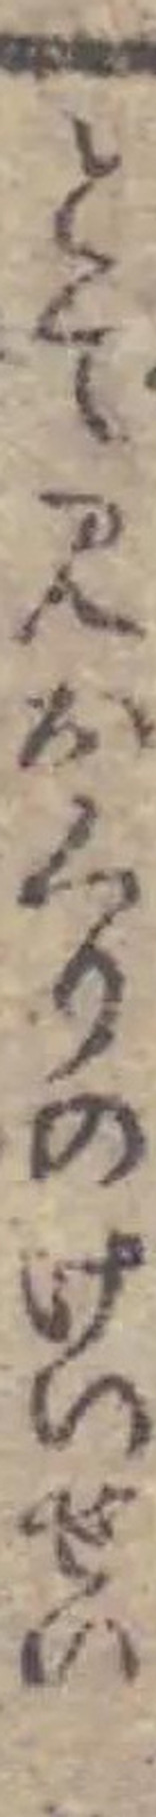とて見おくりのけいせい
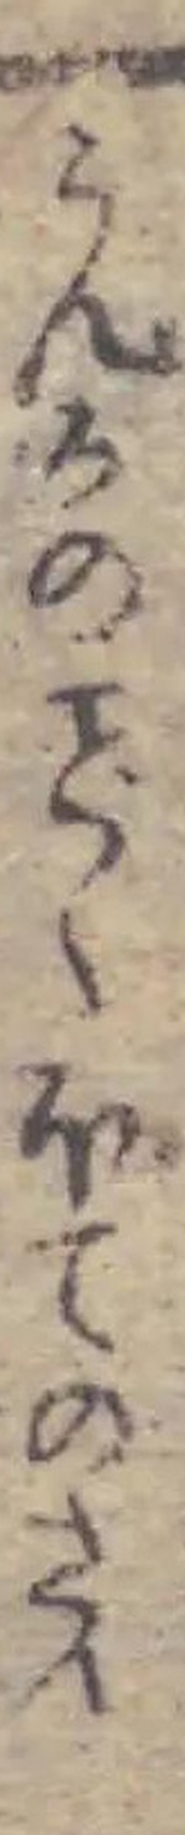うんかのごとくほてのさん
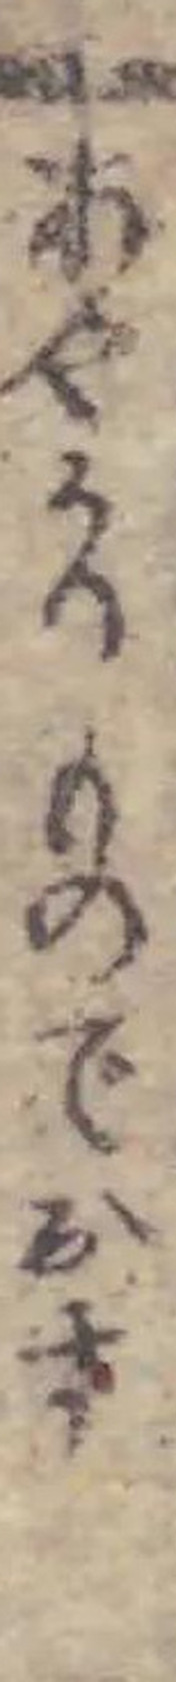あやかりものでお
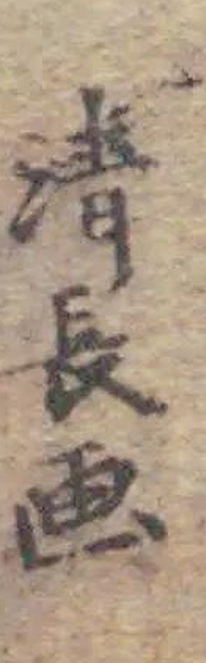清長画
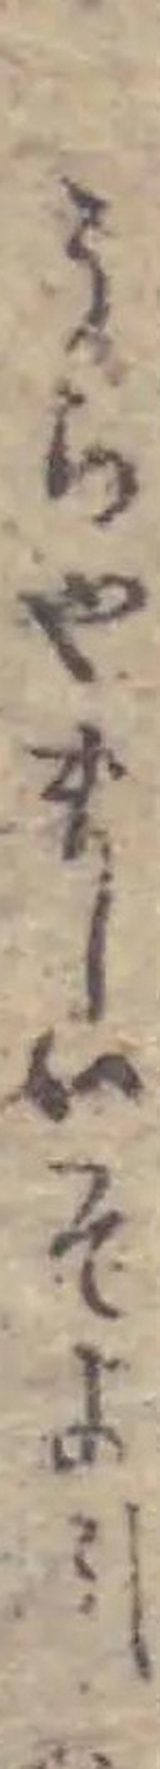うらやましいそよ引
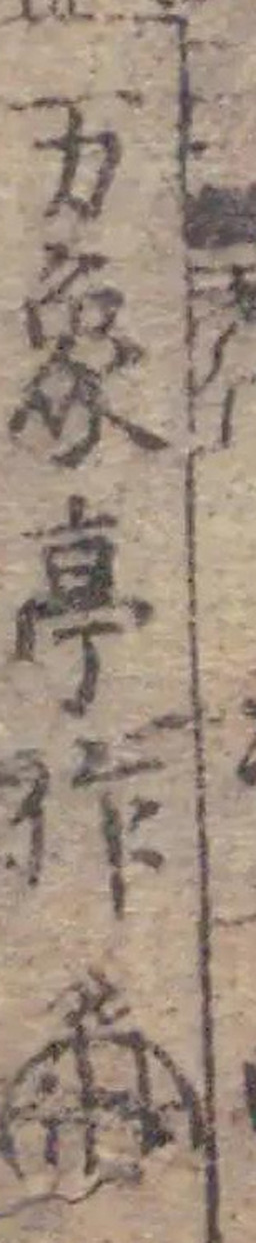万象亭作
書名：色男其処此処 3巻
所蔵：国立国会図書館 National Diet Library, JAPAN
